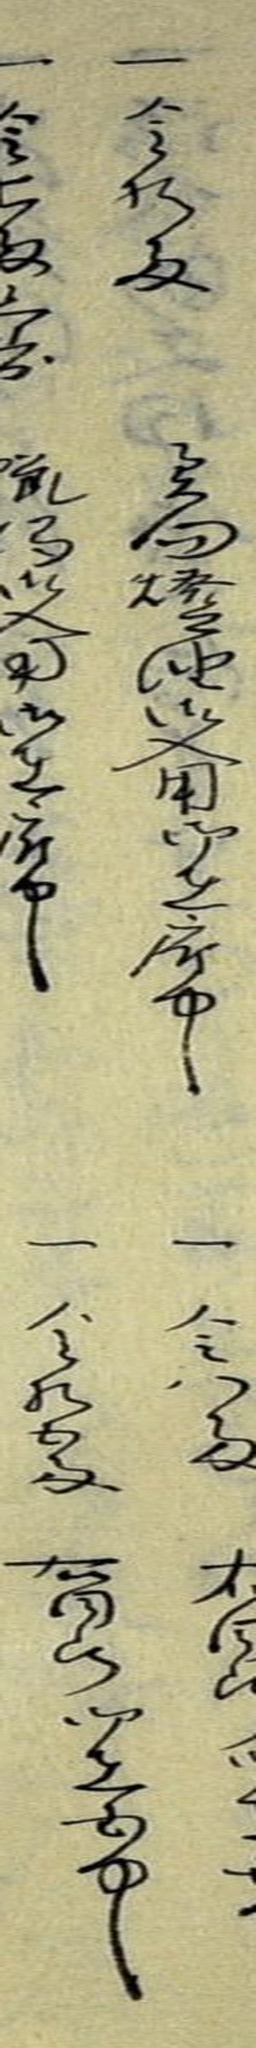一金七両三歩蝋燭御入用御在府中一金拾五両右同断御在国中
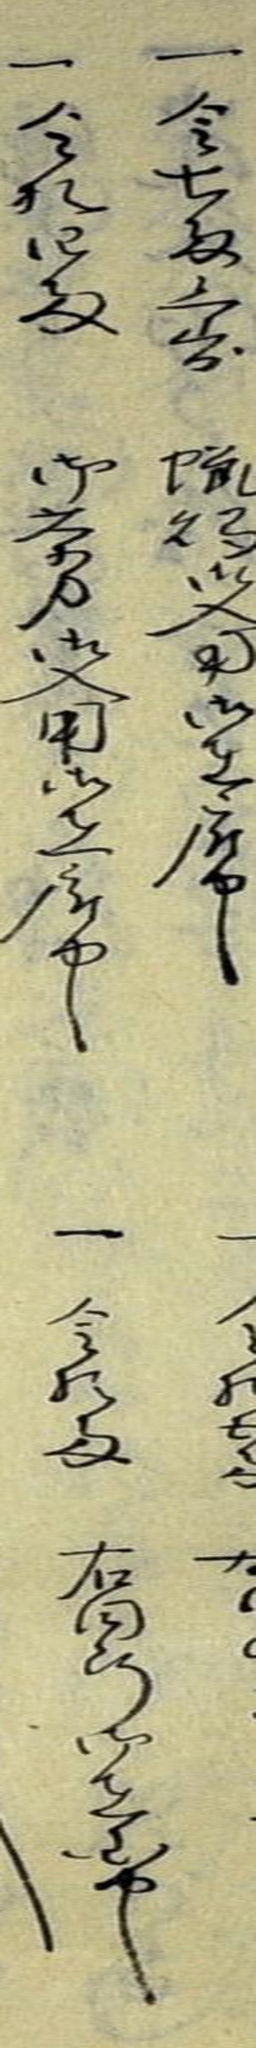一金拾四両御茶方御入用御在府中一金拾両右同断御在国中
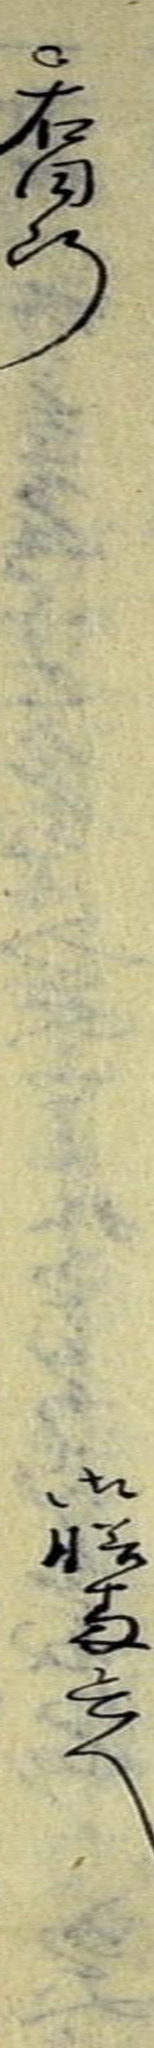〇右同断御膳番壱人
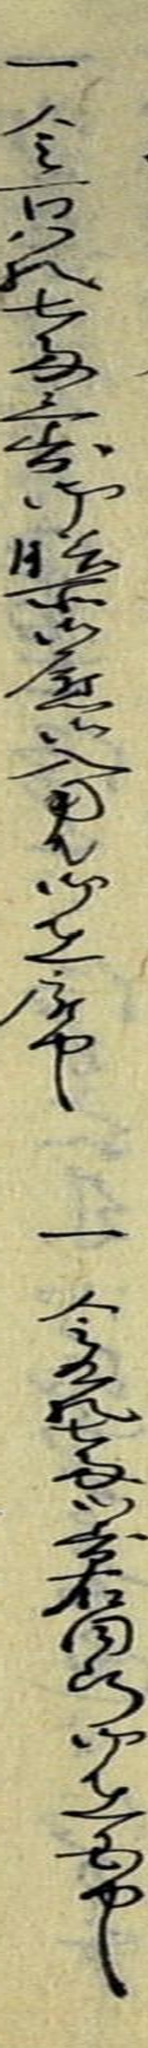一金百八拾七両三歩御膳所御慰御入用共御在府中一金九拾七両弐歩右同断御在国中
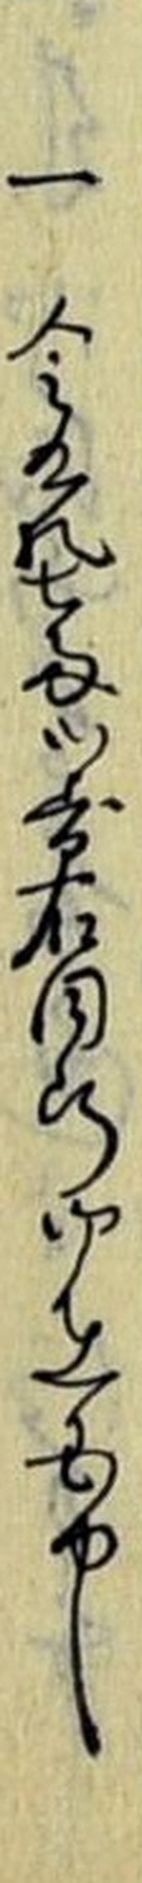一金六拾両御国右同断御在国中分
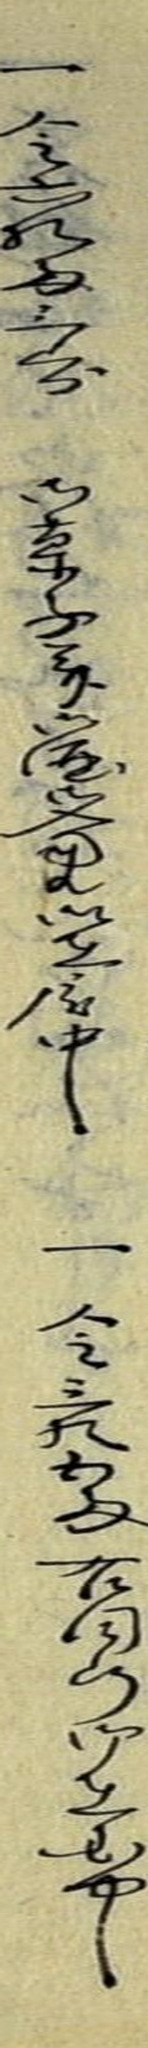一金六拾両三歩御菓子并御酒御入用共御在府中一金三拾五両右同断御在国中
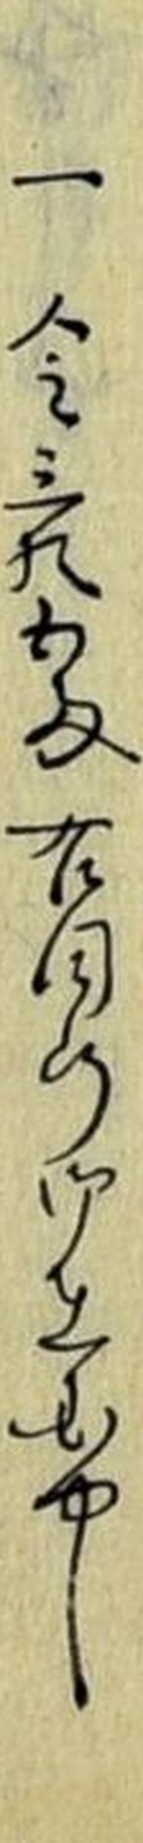一金六拾両御国右同断御在国中分
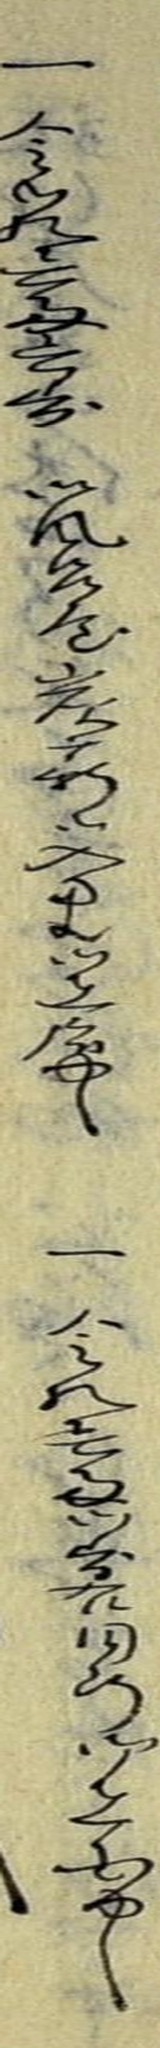一金弐拾壱両壱歩御風呂屋炭薪御入用共御在府中一金拾壱両弐歩右同断御在国中
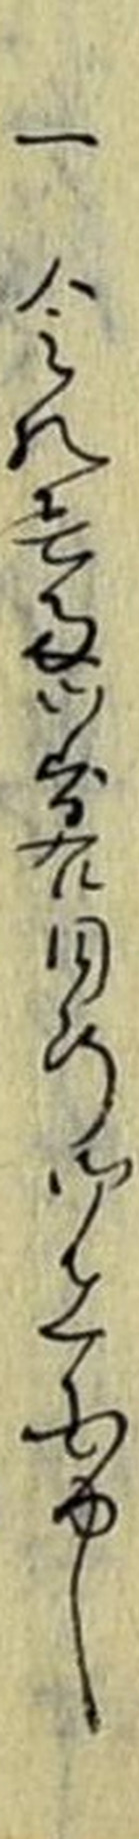一金六拾両御国右同断御在国中分
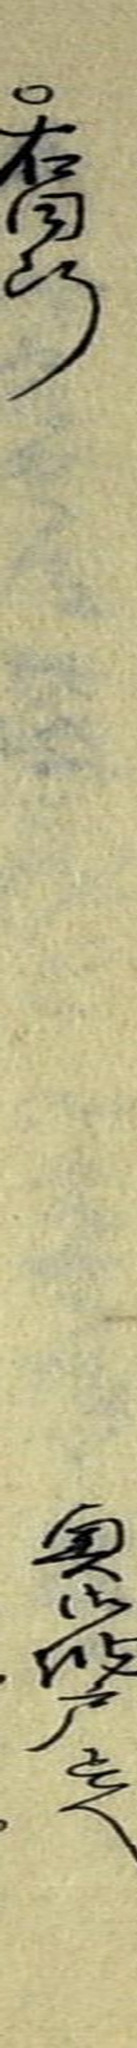〇右同断奥御納戸壱人
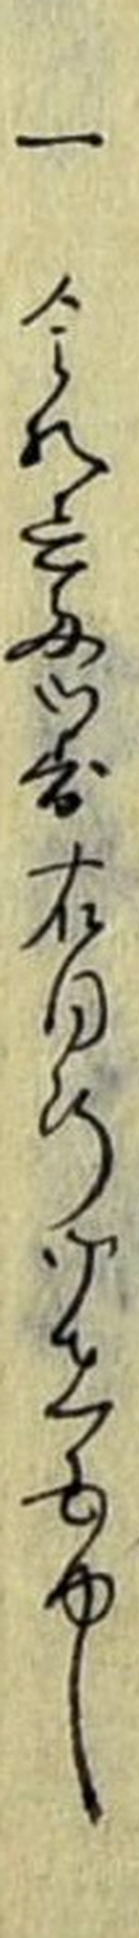一金六拾両御国右同断御在国中分
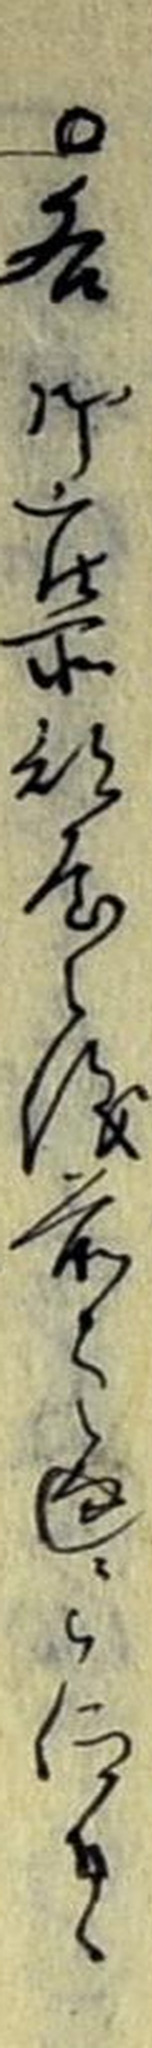〇各御座所部屋之儀前々之通に被仰付候中老中
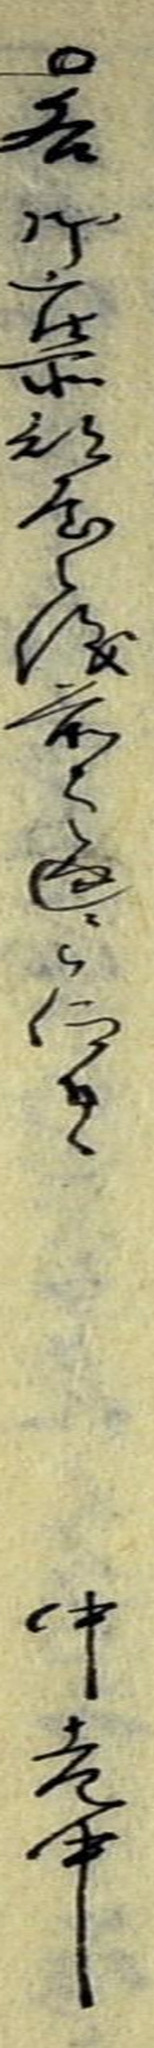〇各御座所部屋之儀前々之通に被仰付候中老中
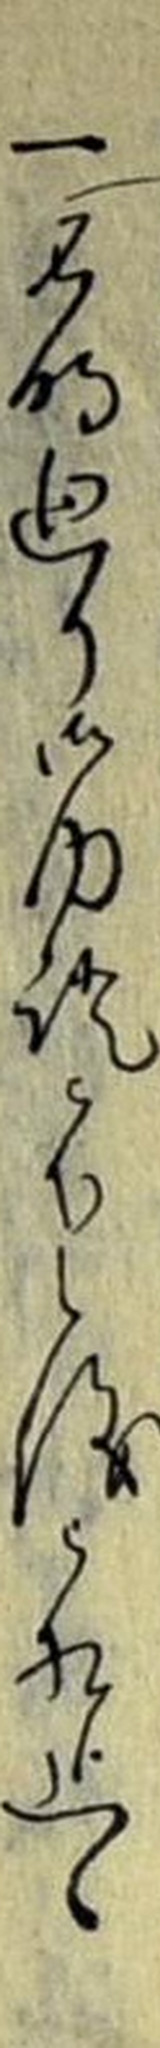一不時廻り御内証被下候儀被相止候
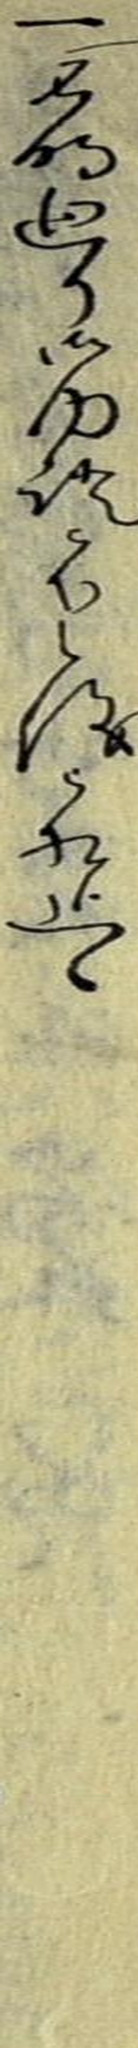一不時廻り御内証被下候儀被相止候
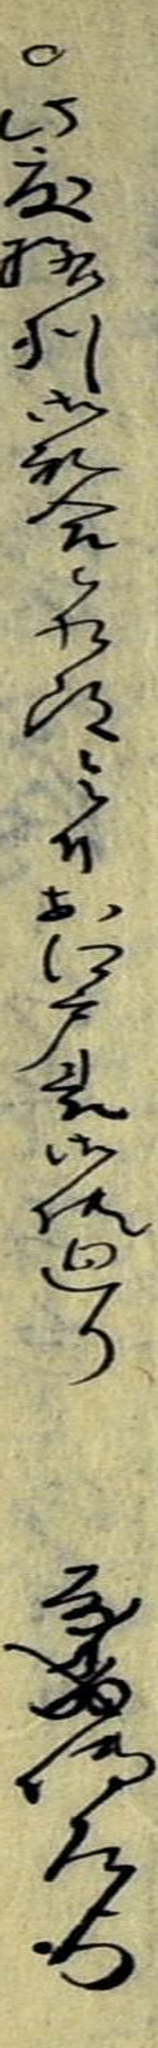〇此度格別御形合被相改候に付於江戸表御供廻り雨森伝左衛門
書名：命令之部 二
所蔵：福井県文書館 Fukui Prefectural Archives
